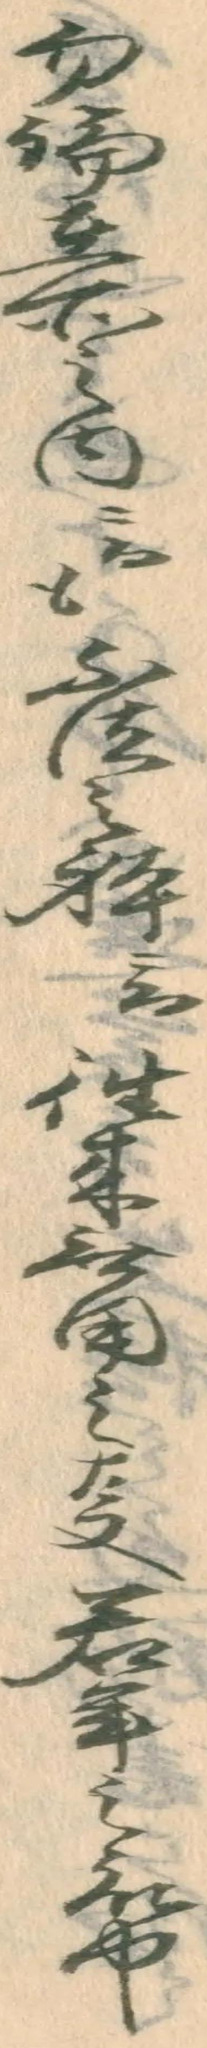勿論在所之内ニ而も不法之体ニ而往来無用之事若年之衆中
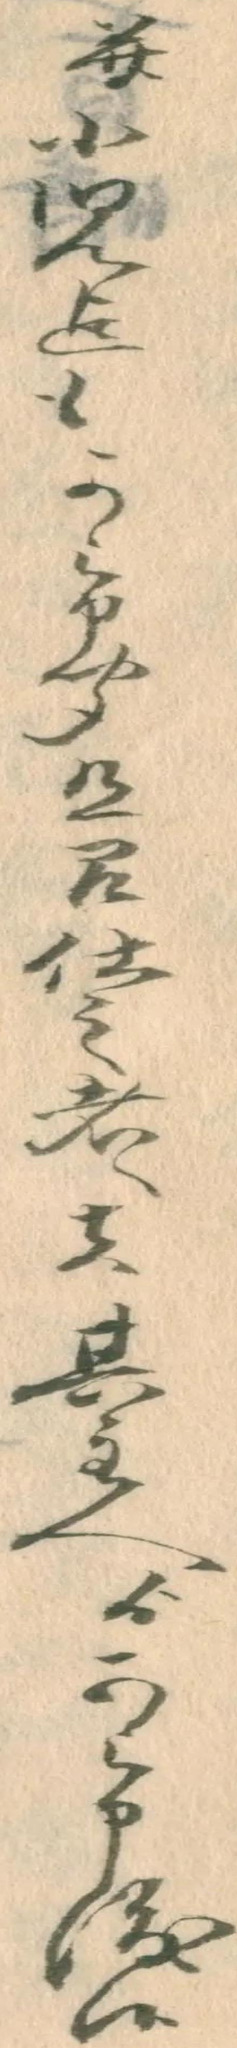并小児迄も可被申聞且召仕之者へは其主人ゟ可申渡候
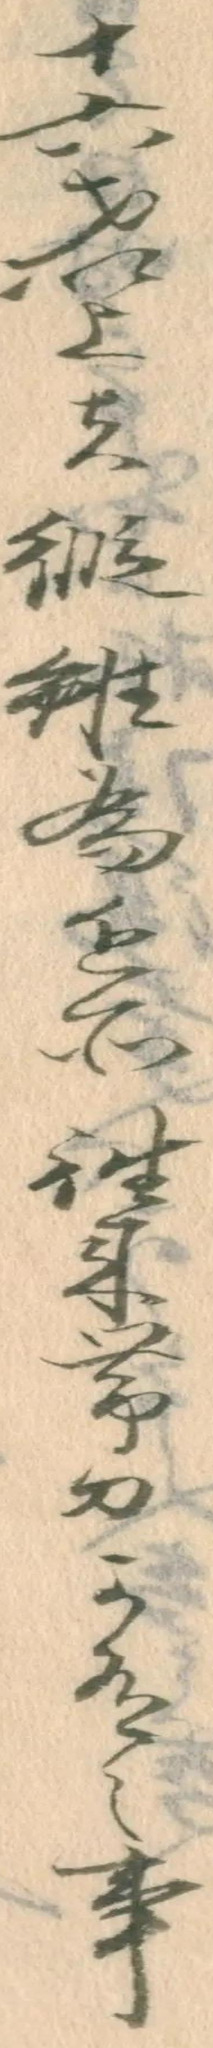十六才以上は縦雖為近所往来帯刀可有之事
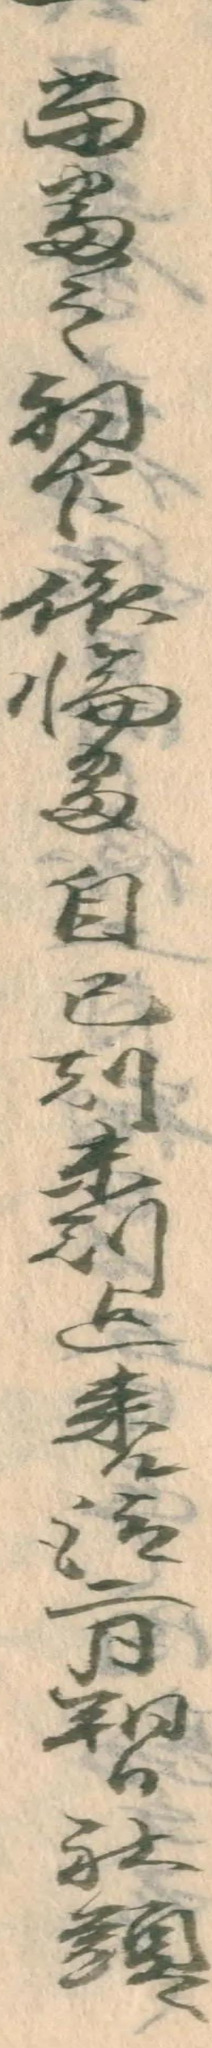一当番之祠官依輪番自巳刻未刻迄来ル請二月朔日社頭へ
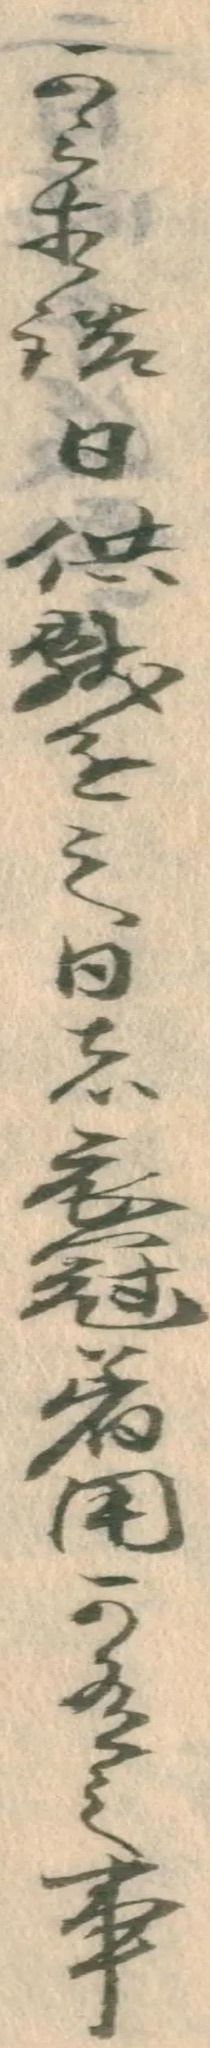可被相詰日供献進之日は衣冠着用可有之事
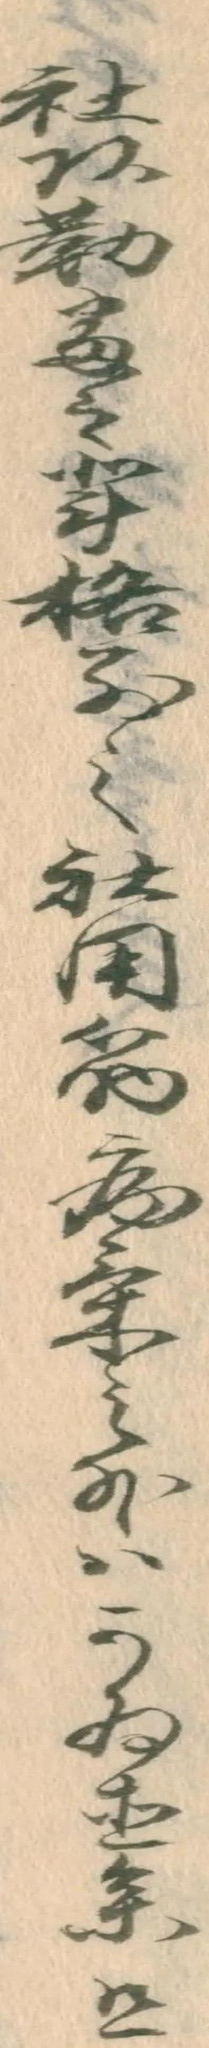一社頭勤番之輩格別之社用筋病気之外ハ可為直参且
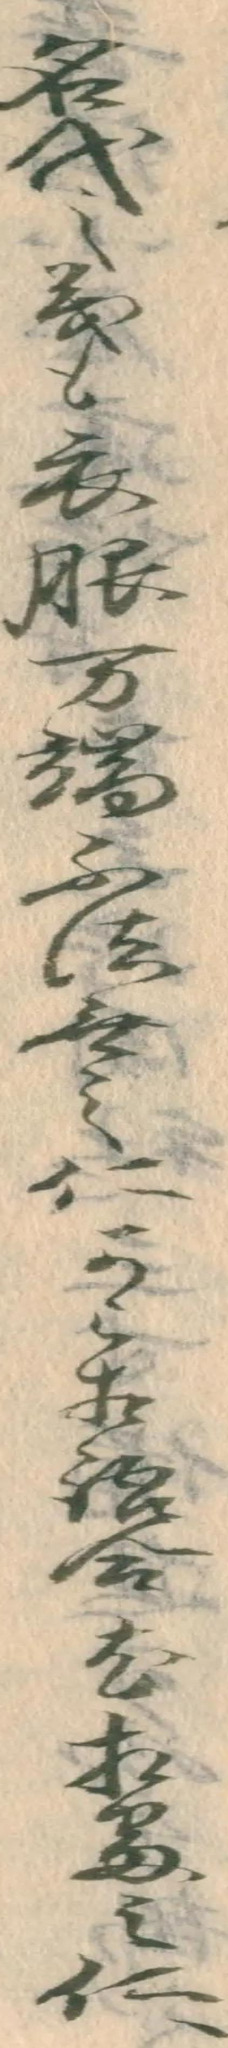名代之義も衣服万端不法無之仁可被相語合尤相番之仁へ
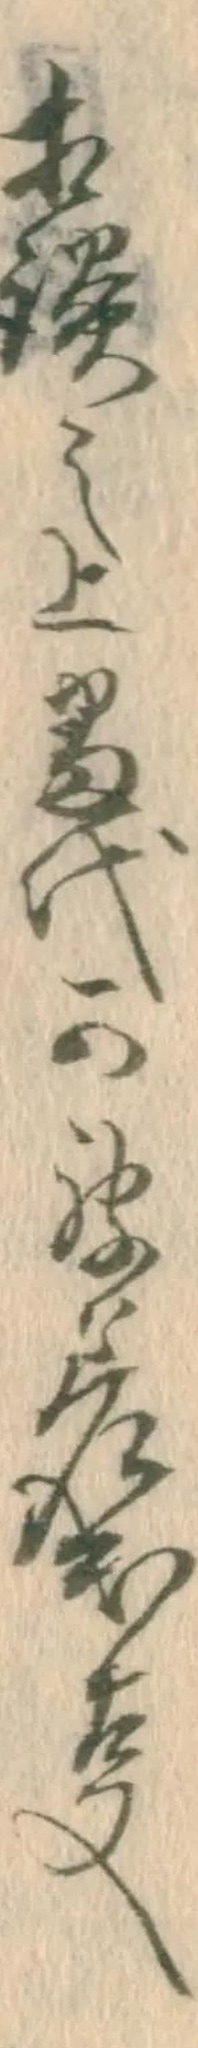相談之上番代可被差出事
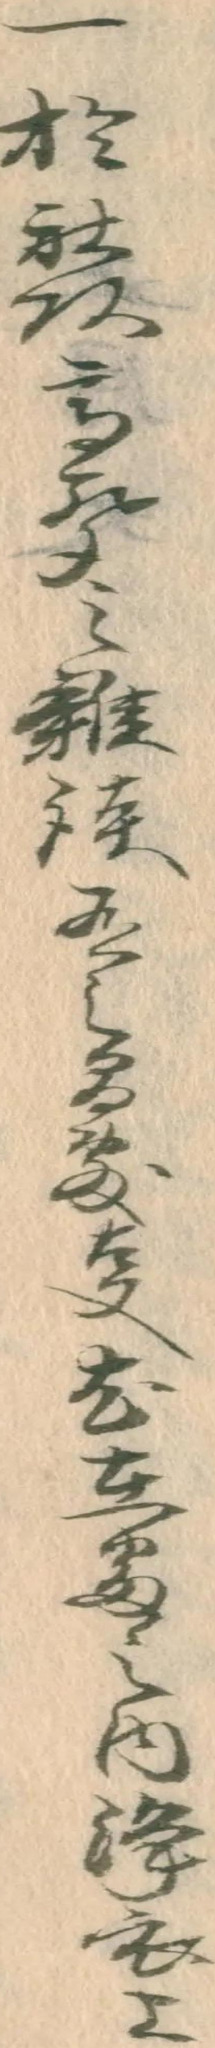一於社頭高声之雑談有之間敷事尤在番之内浄衣上
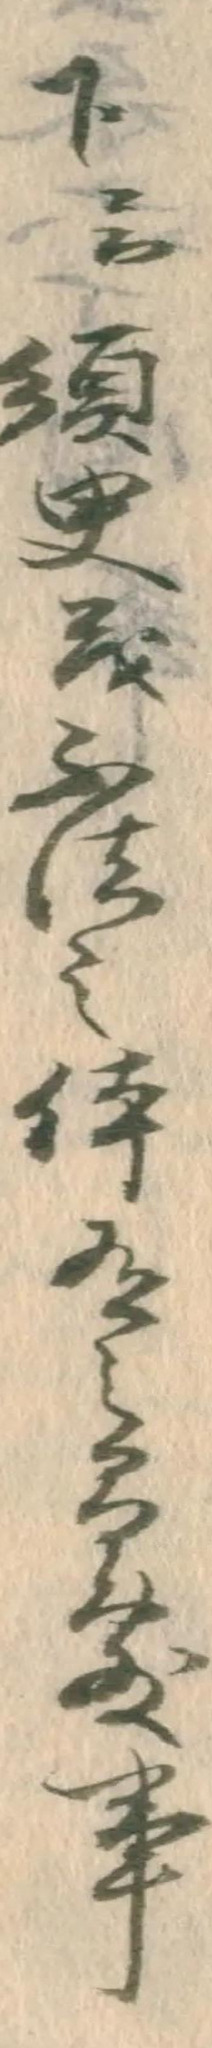下ニ而須曳茂不法之体有之間敷事
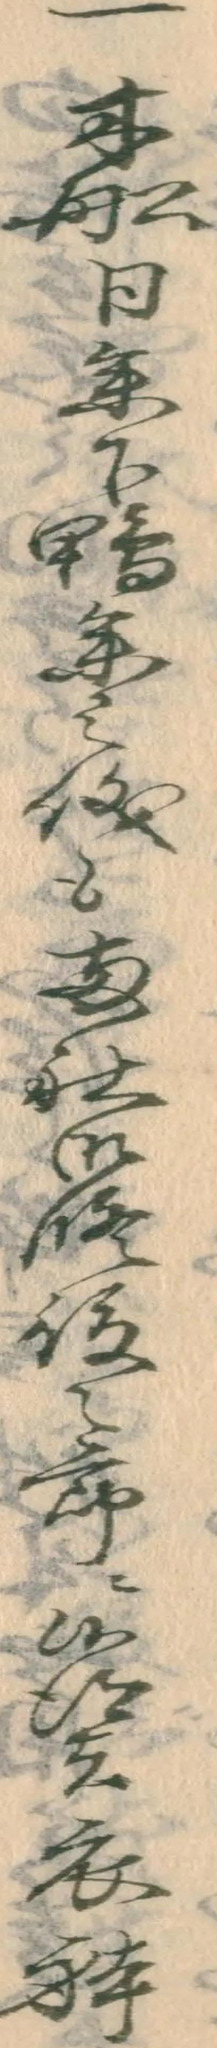一木船日参下鴨参之儀も両社御修復之節ニ候得は衣体
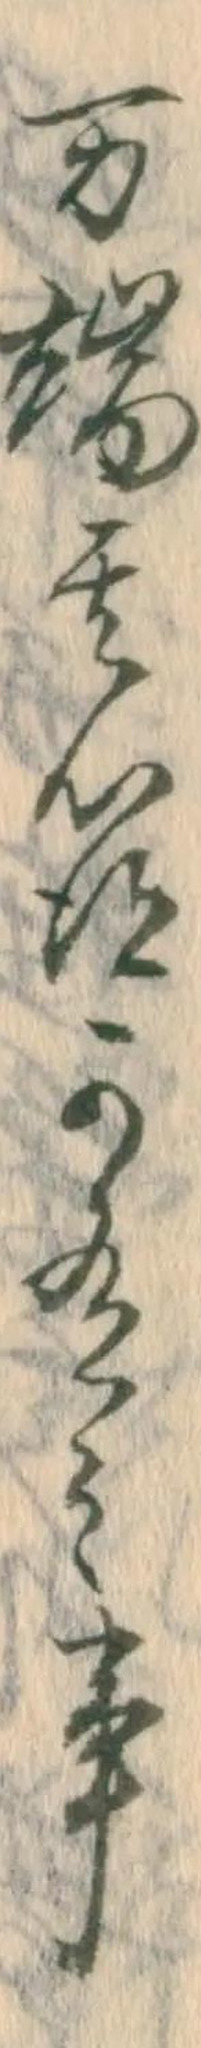万端其心得可有之事
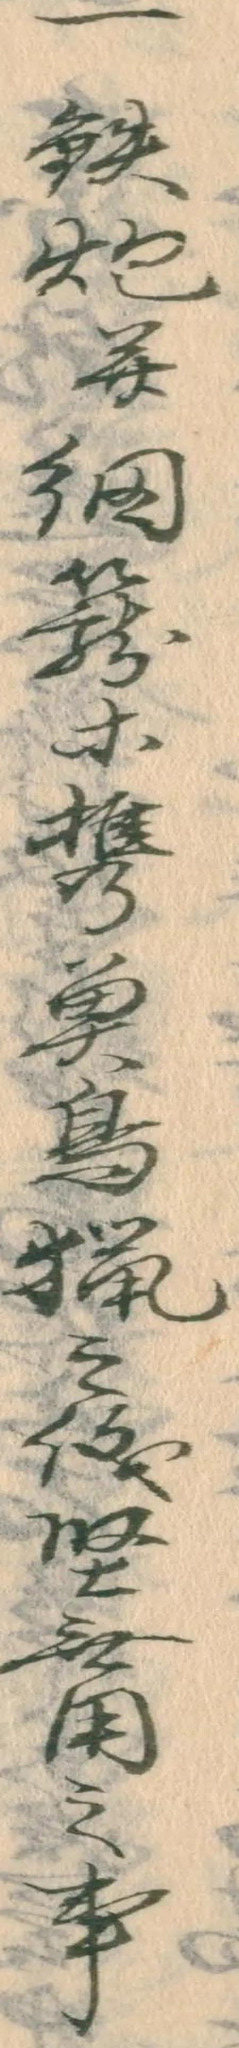一鉄炮并網籠等携魚鳥猟之儀堅無用之事
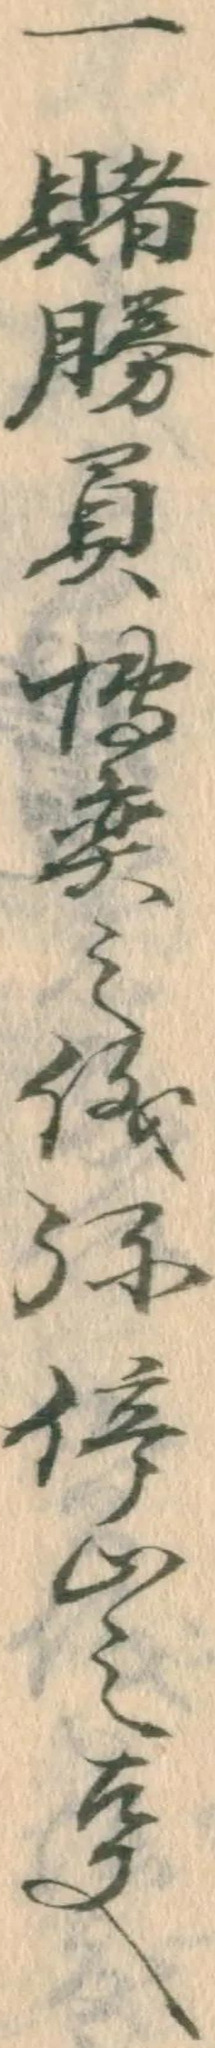一賭勝負博奕之儀弥停止之事
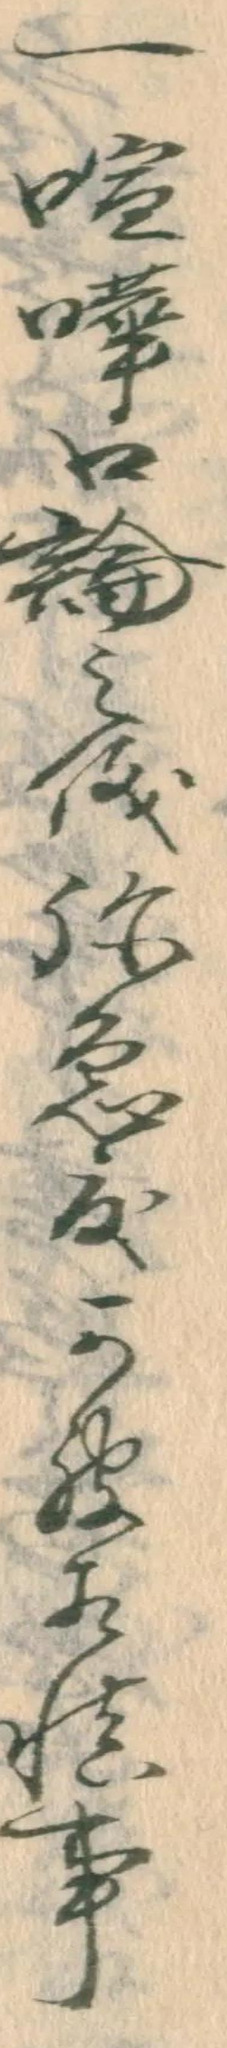一喧嘩口論之儀弥急度可被相慎事
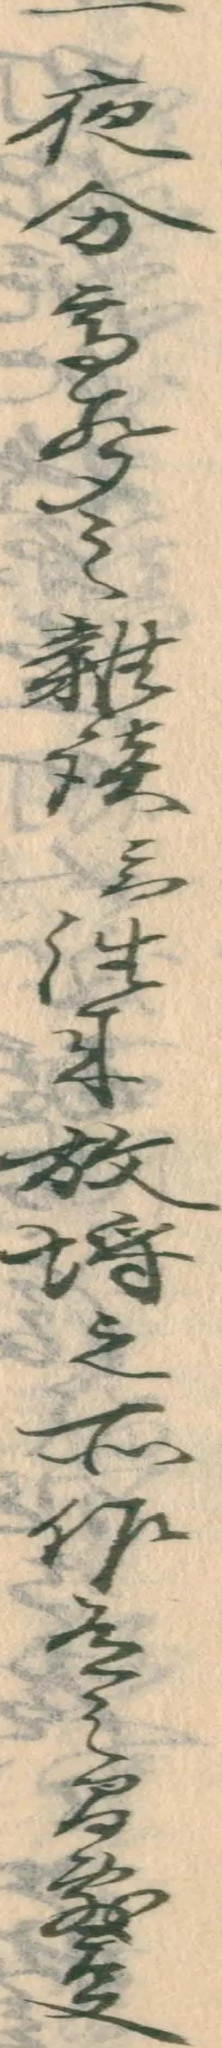一夜分高声之雑談ニ而往来放埒之所作有之間敷事
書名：賀茂社記録. 第17冊
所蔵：国立国会図書館 National Diet Library, JAPAN
